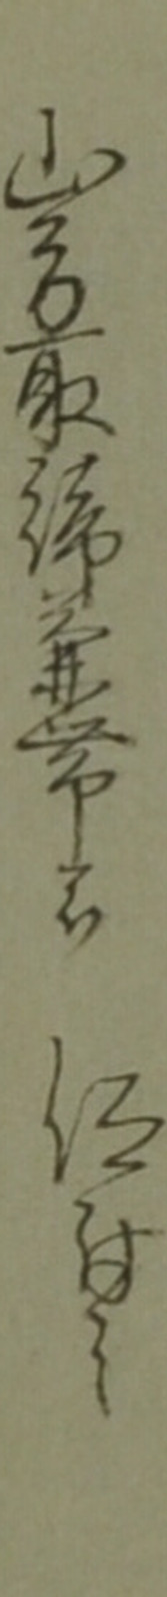山方取締兼帯被仰付之
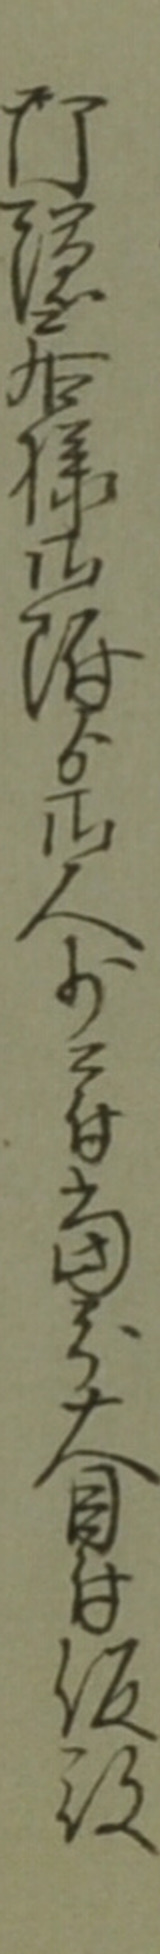御隠居様御附ゟ御人少ニ付当分大目付仮役
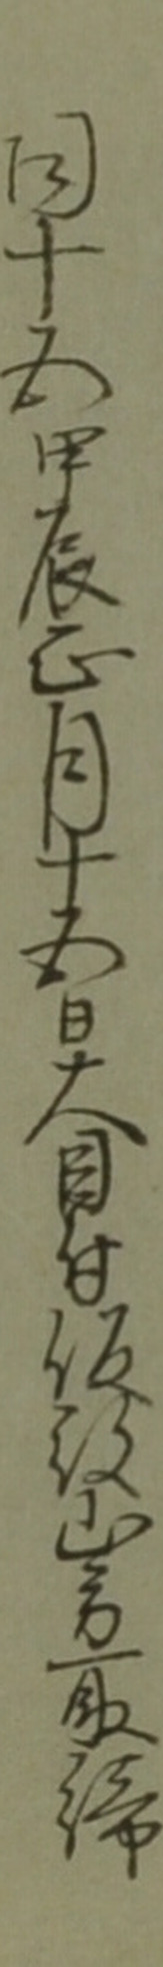一同十五甲辰正月十五日大目付仮役山方取締
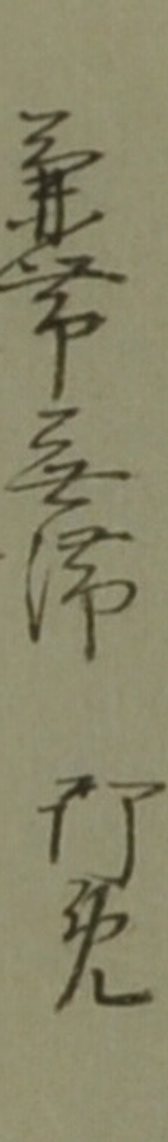兼帯無滞御免
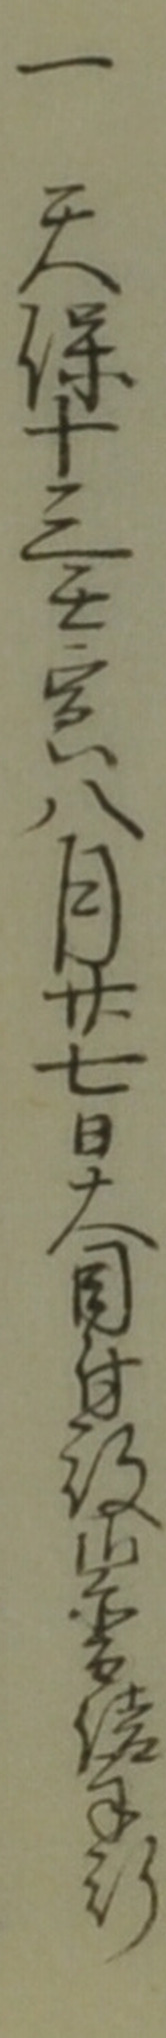一天保十三壬寅八月廿七日大目付役御普請奉行
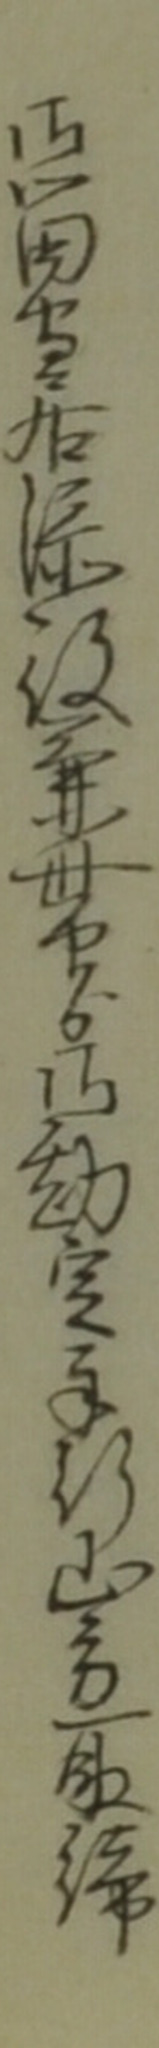御留守居添役兼帯ゟ御勘定奉行山方取締
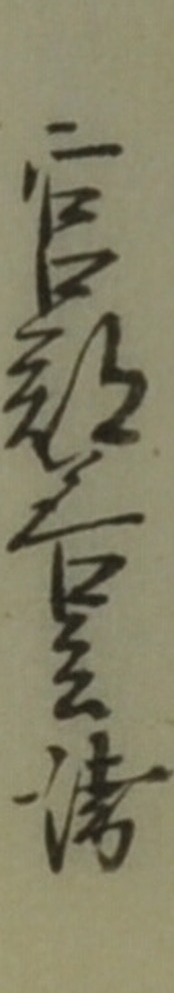宮部善兵衛
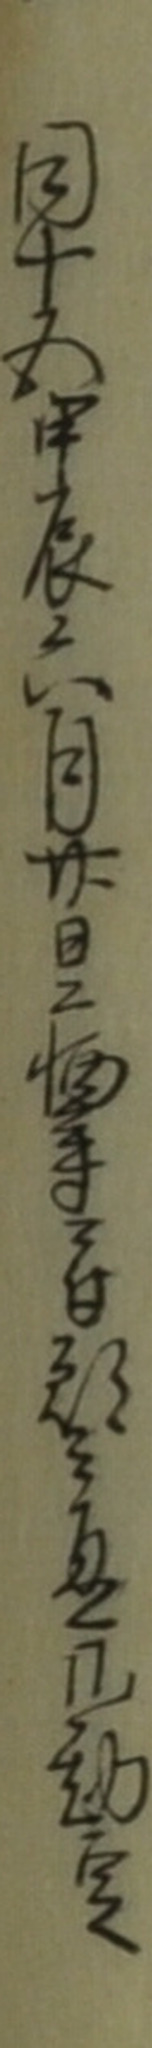一同十五甲辰六月廿日病気ニ付願之通御勘定
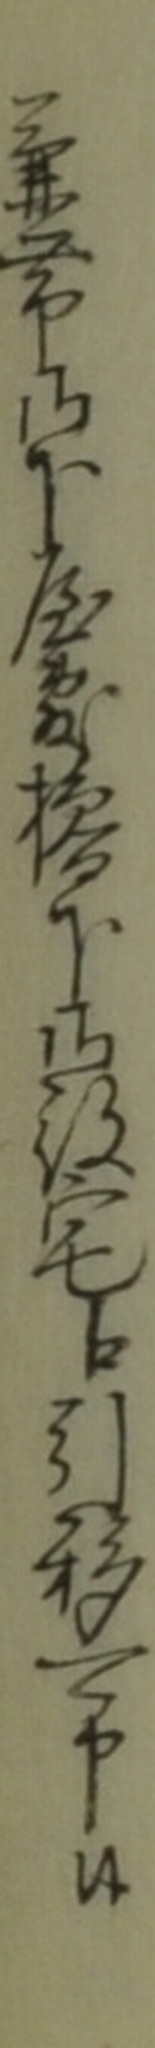兼帯御下屋敷櫓下御役宅江引移可申候
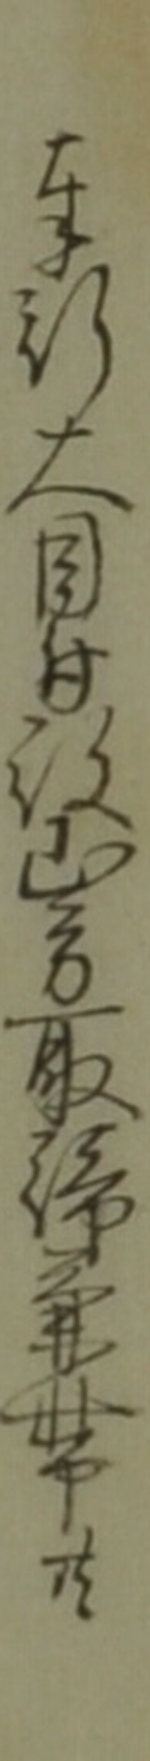奉行大目付役山方取締兼帯共
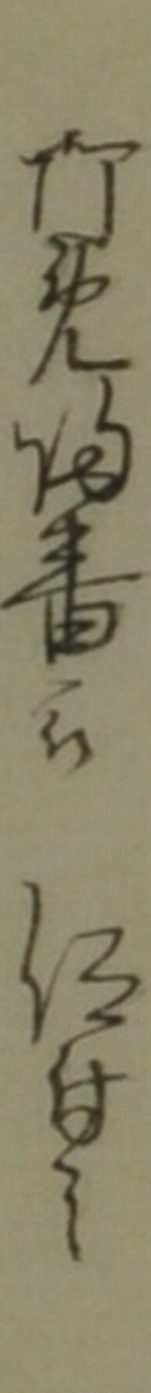御免帰番被仰付之
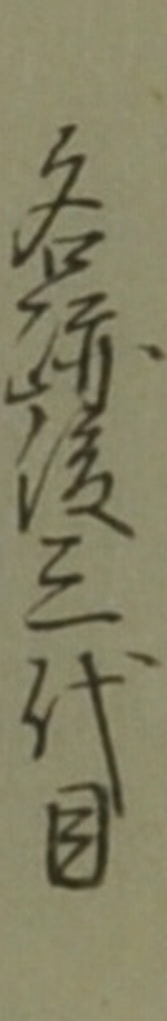名跡後三代目
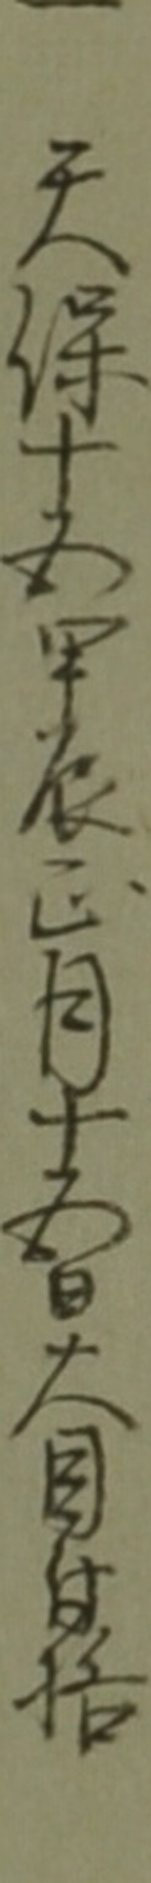一天保十五甲辰正月十五日大目付格
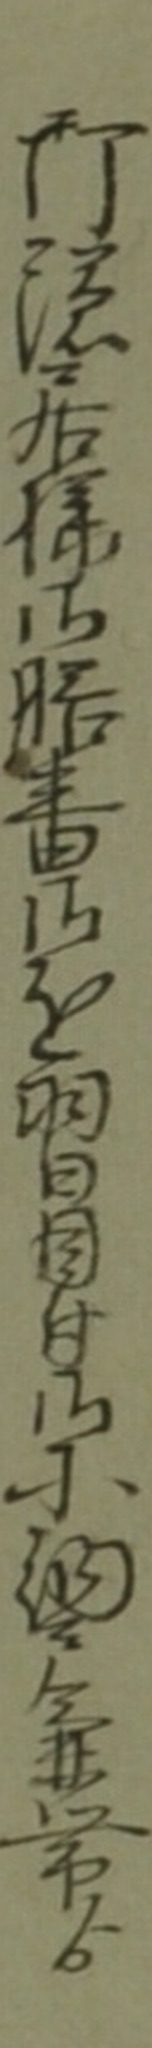御隠居様御膳番御近習目付御小納戸兼帯ゟ
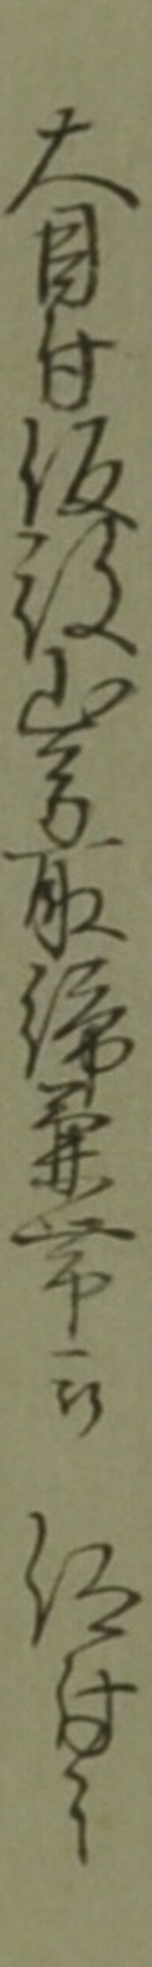大目付仮役山方取締兼帯被仰付之
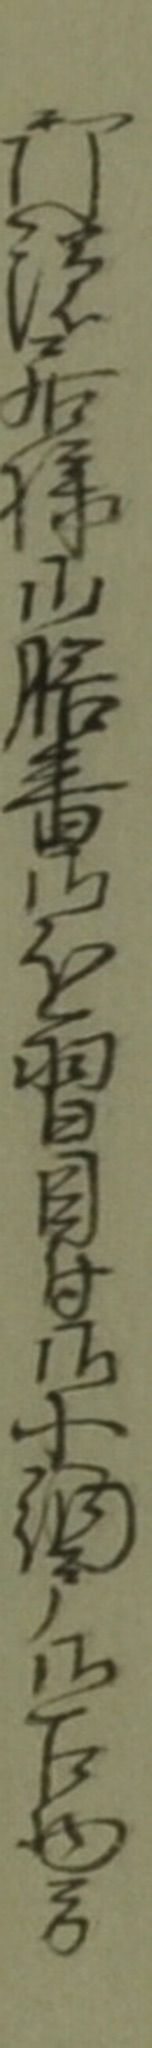御隠様御膳番御近習目付御小納戸御召物方
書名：諸御役代々録（三）
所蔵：伊那市立高遠町図書館・合同会社AMANE
